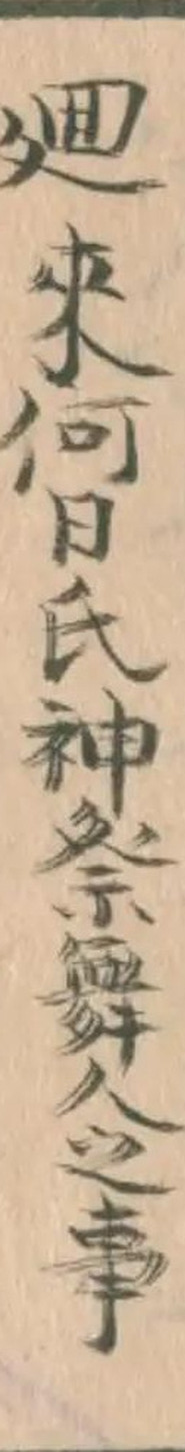廻来何日氏神祭舞人之事
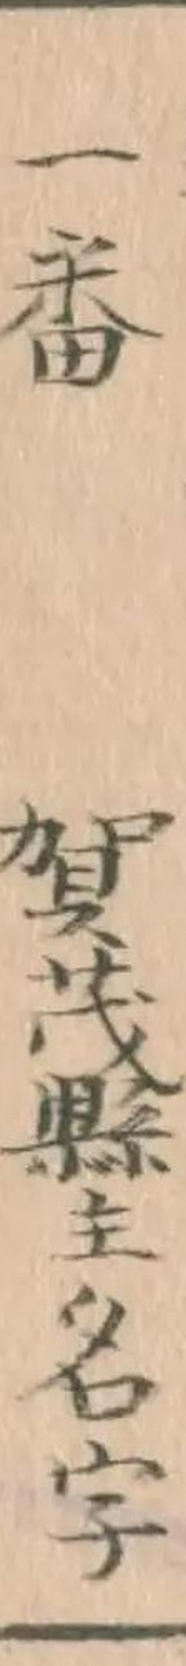一番賀茂縣主名字
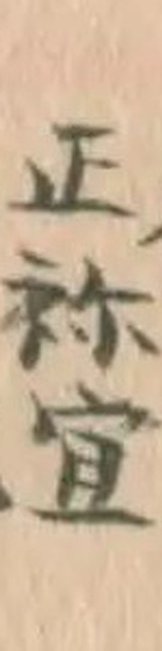正弥宜
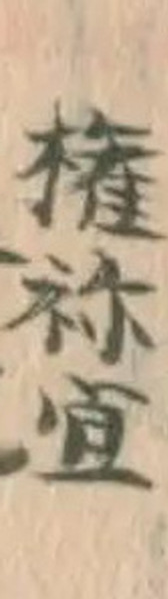権弥宜
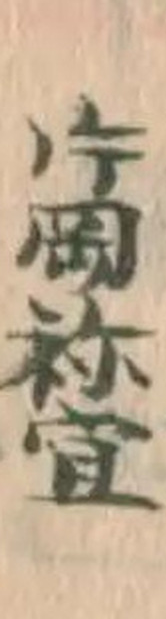片岡祢宜
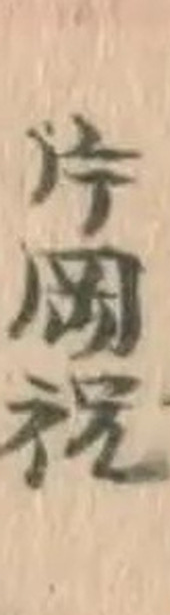片岡祝
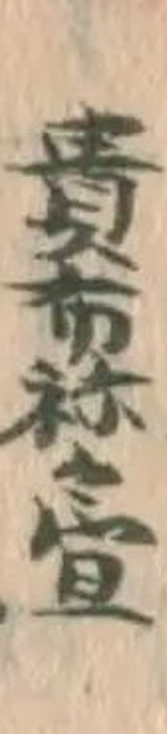貴布祢々宜
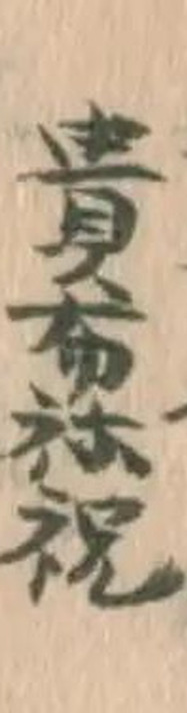貴布祢祝
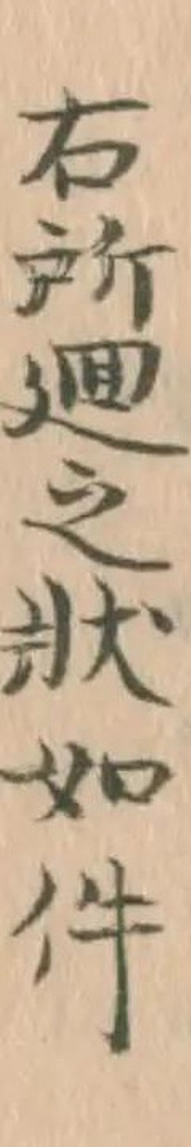右所廻之状如件
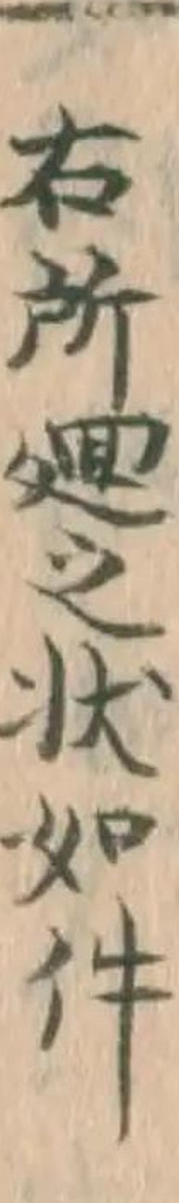右所廻之状如件
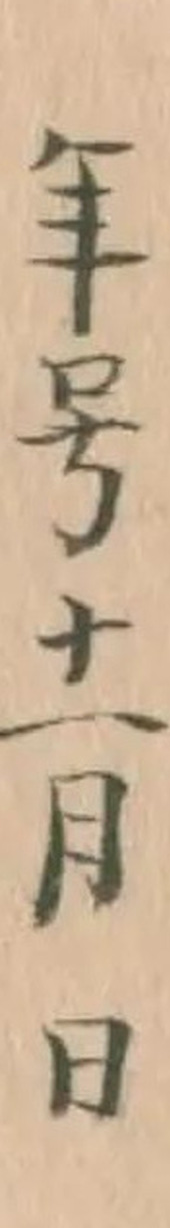年号十一月日
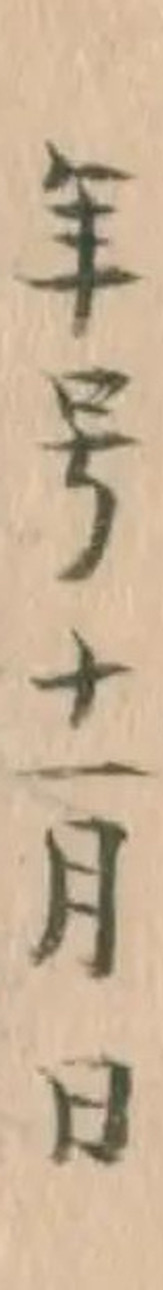年号十一月日
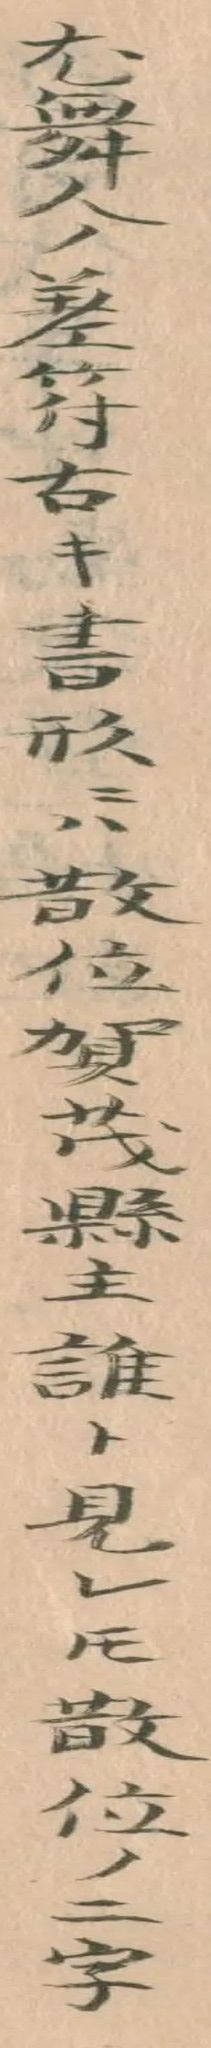尤舞人ノ差符古キ書形ニハ散位賀茂縣主誰ト見レトモ散位ノ二字
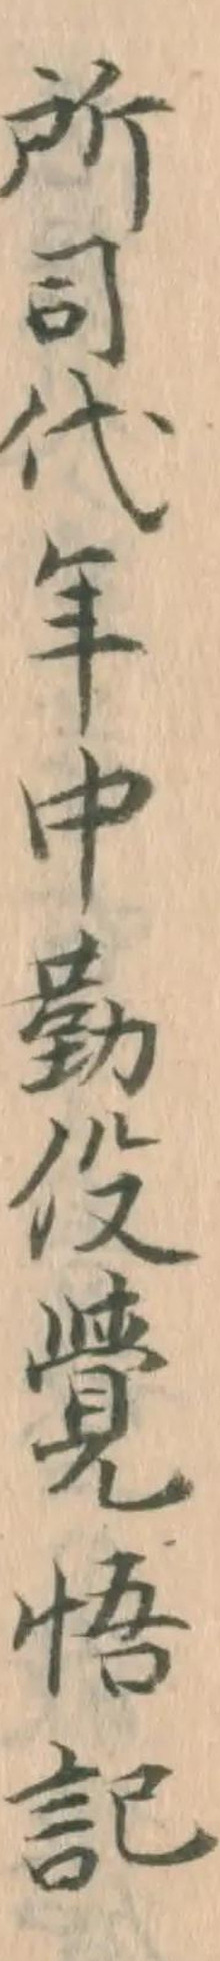所司代年中勤役覚悟記
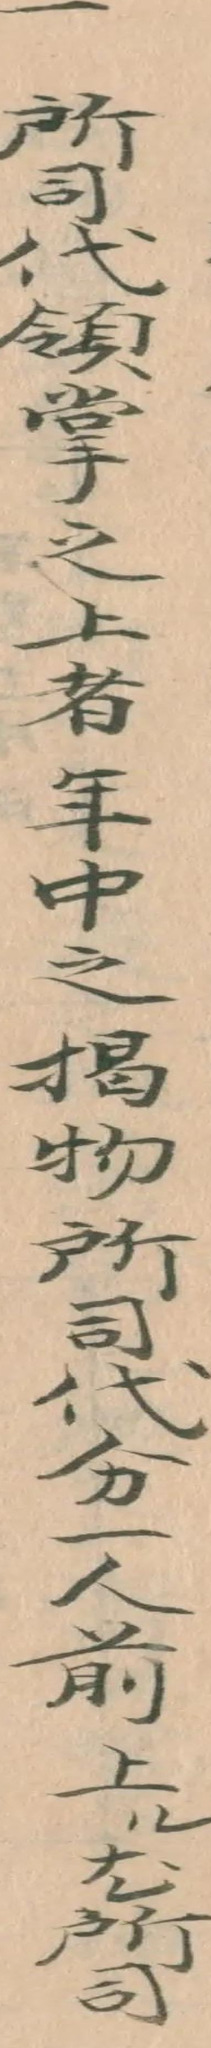一所司代領掌之上者年中之掲物所司代分一人前上ル尤所司
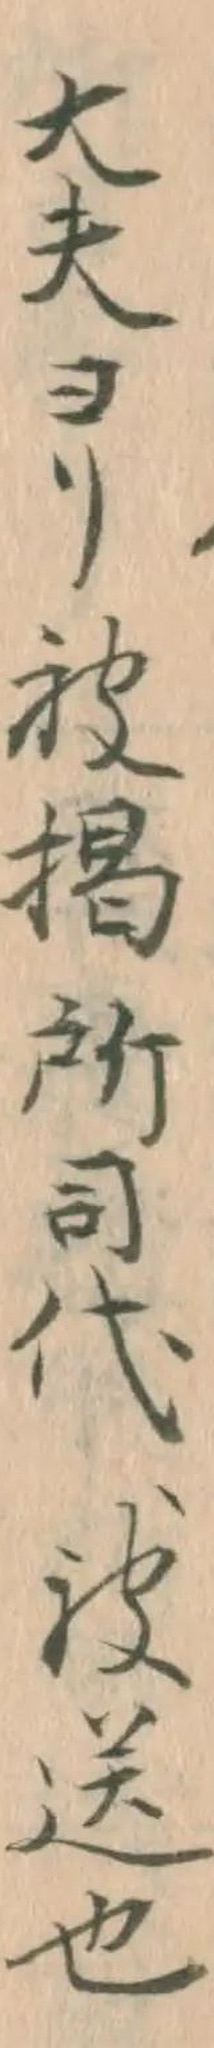大夫より被掲所司代ヘ被送也
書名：賀茂社記録. 第40冊
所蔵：国立国会図書館 National Diet Library, JAPAN
